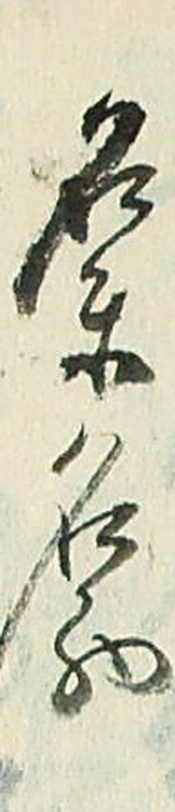名東名西
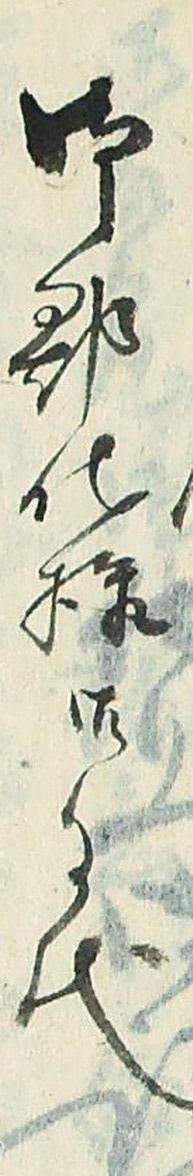御郡代様御手代
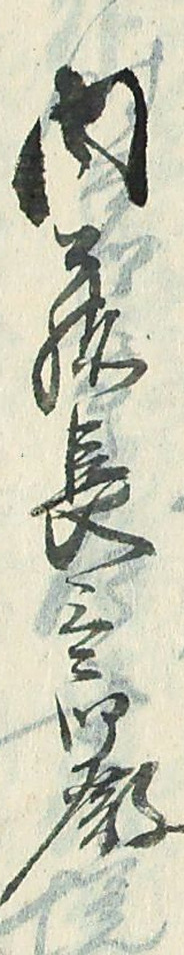内藤長三郎殿

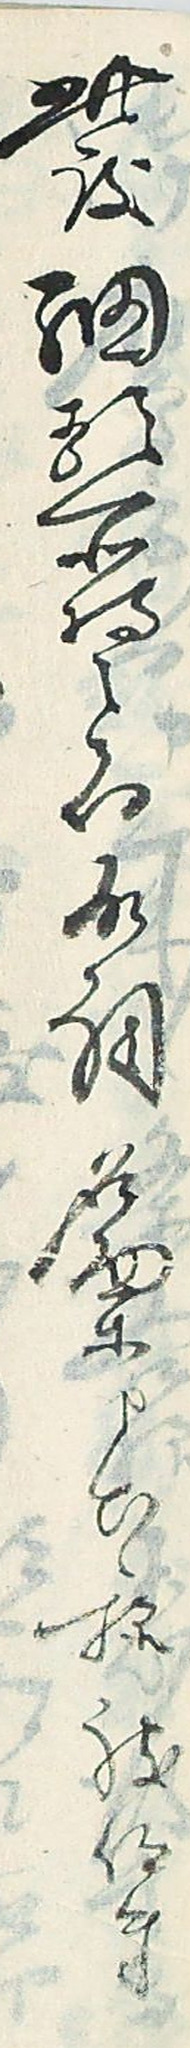此度網類所持之者取調名面等可申出候様被仰付
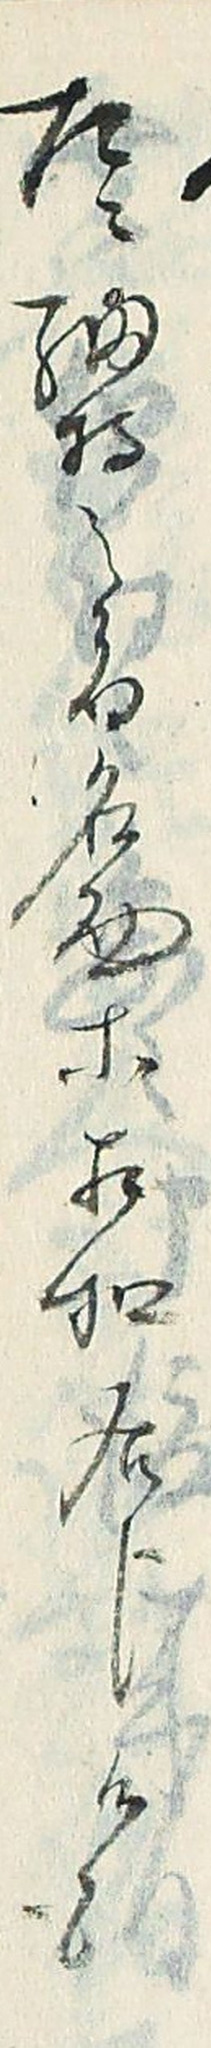左に網持之者名面等相扣居申候以上
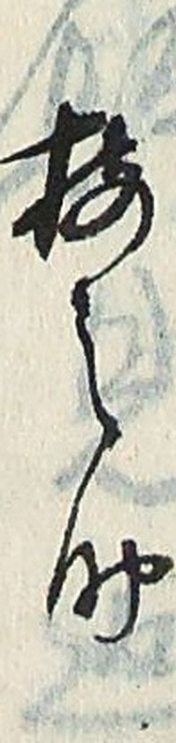梅之助
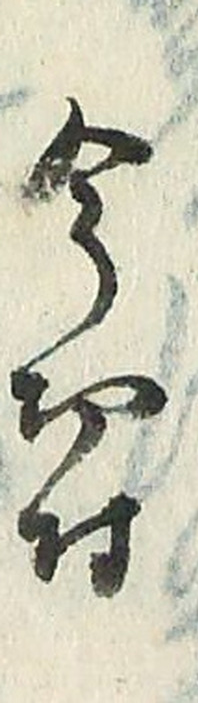今切村
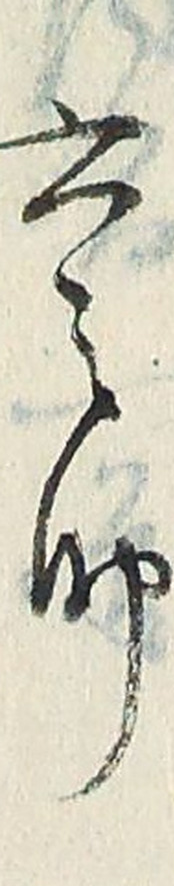六之助
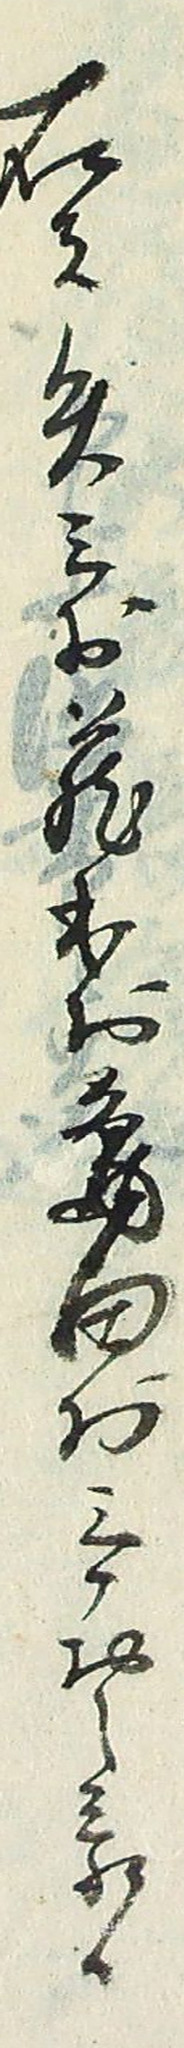右は矢三村蔵本村島田村三ケ村之義は
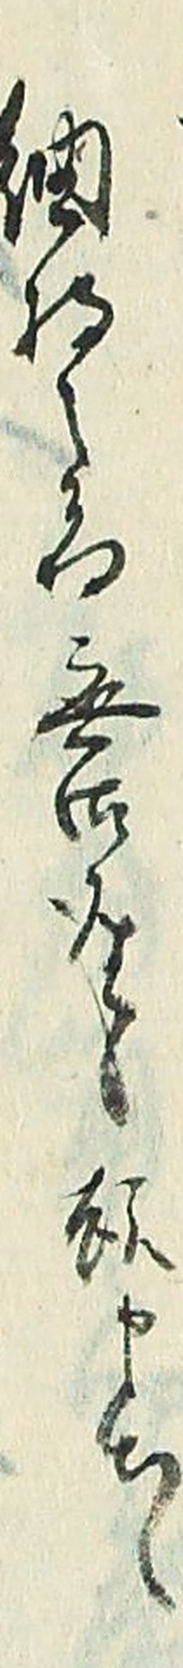網持之者無御座候趣申出候
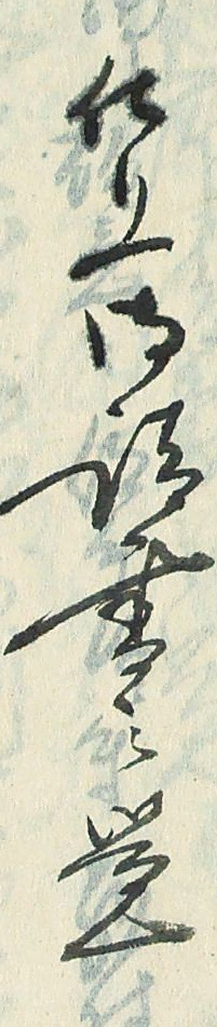仕上御請書之覚
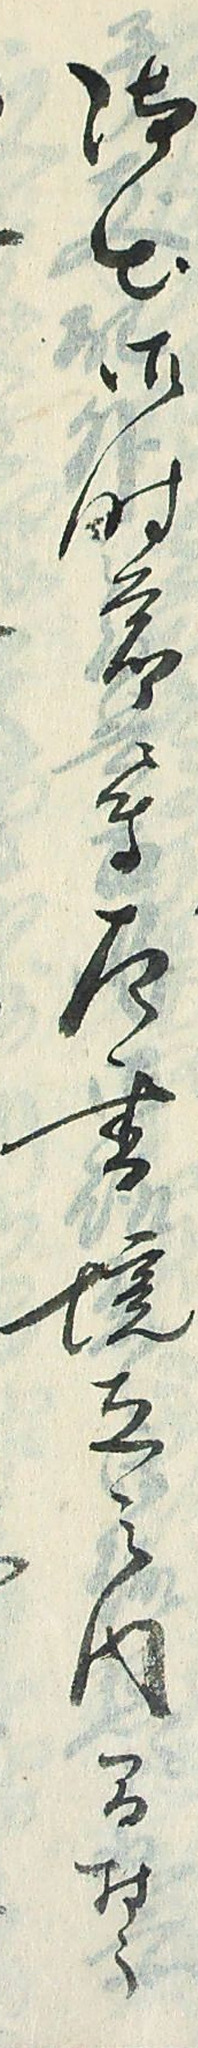御出御時節に付左書境立之内間村々
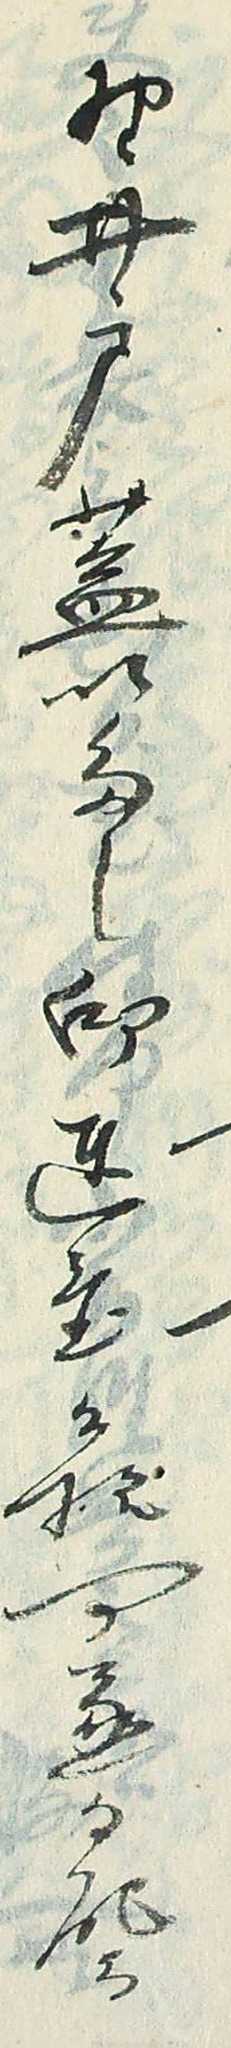野井戸蓋いたし印建置候様可遂手配旨

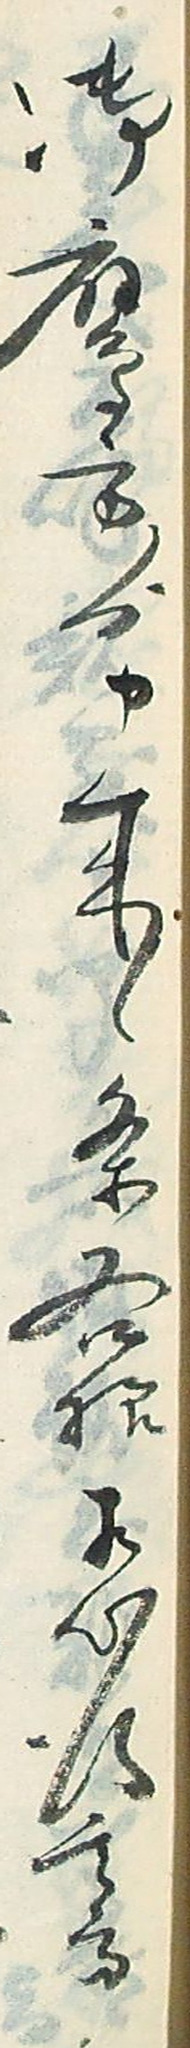御鷹方ゟ申来候条右様相心得其方
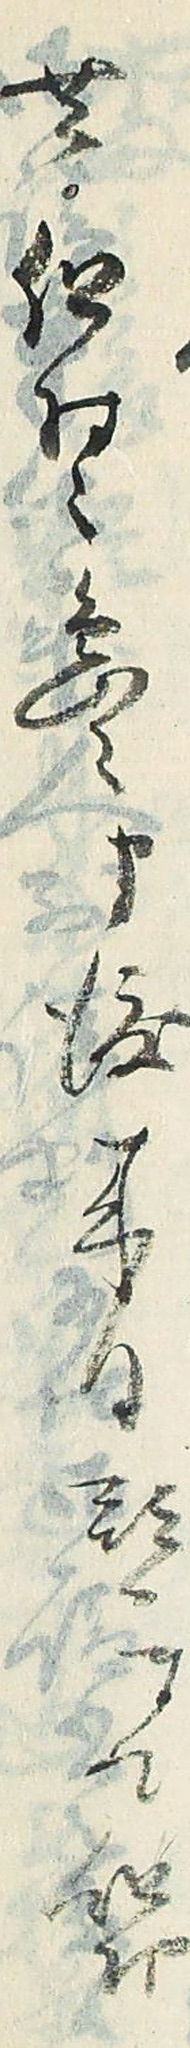共組村々急々申渡来月朔日まて組切
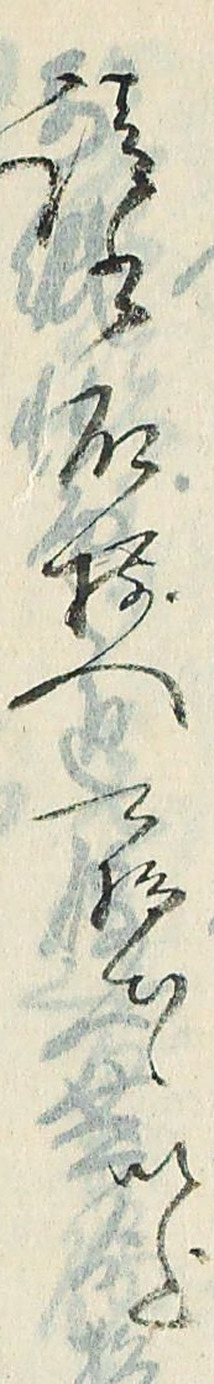請書取揃へ可指出候以上
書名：諸御用御□受書控
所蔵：鳴門教育大学 Naruto University of Education
